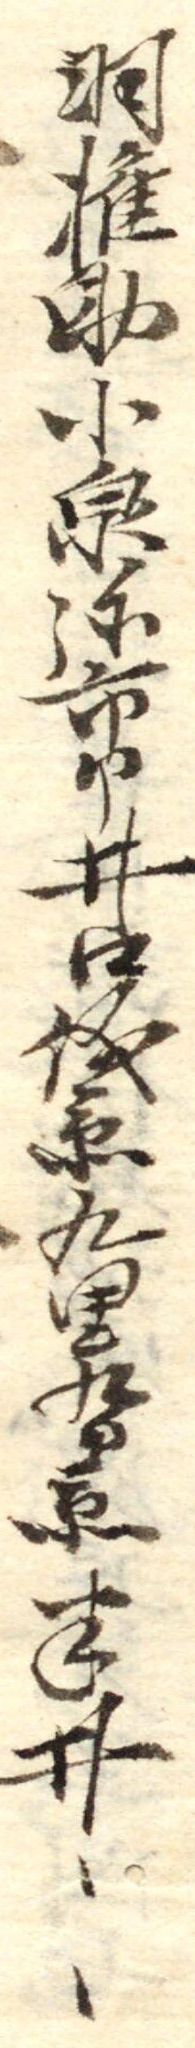羽権助小泉孫市郎井口儀兵衛九里九兵衛半井ーー
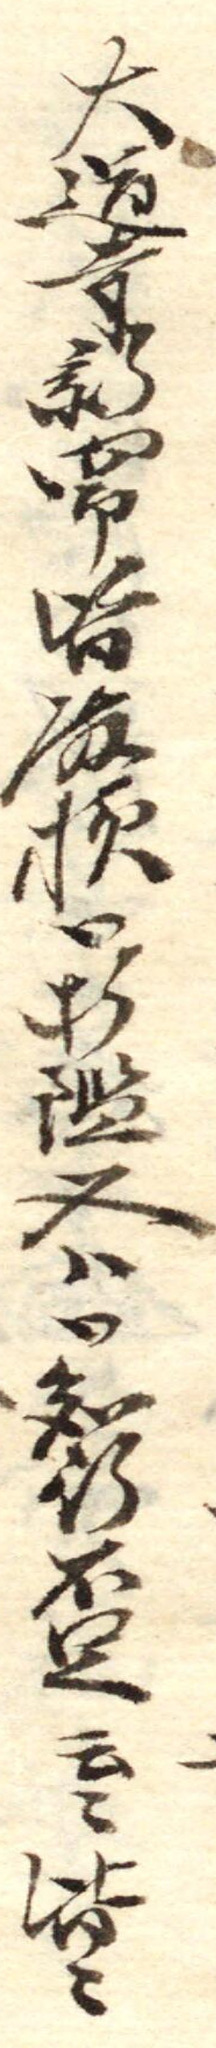大道寺新四郎皆殿様御折鑑又は御知行不足云々皆々
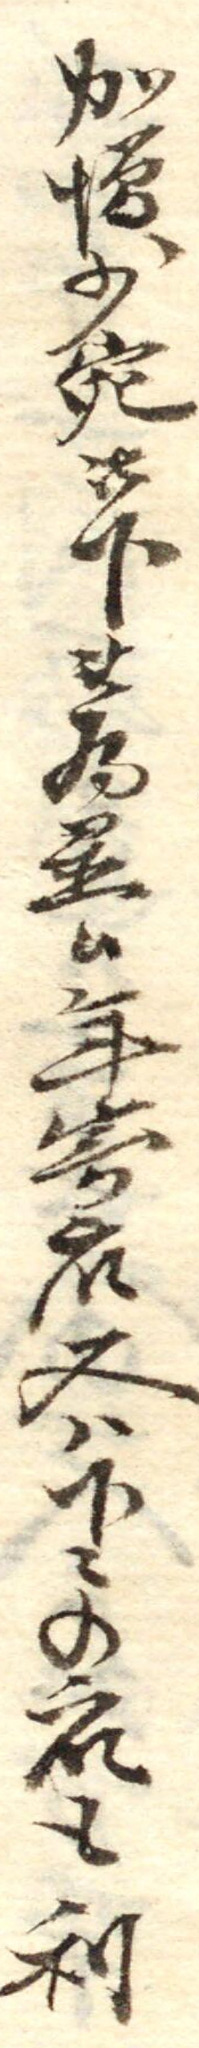加増少宛被下被為置候年寄衆又は下々の衆も利
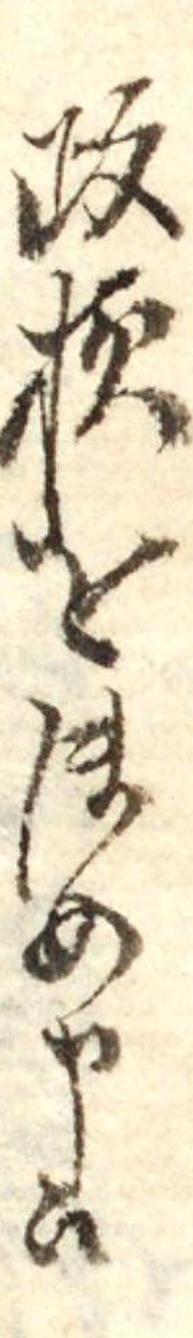政様をほめ申候
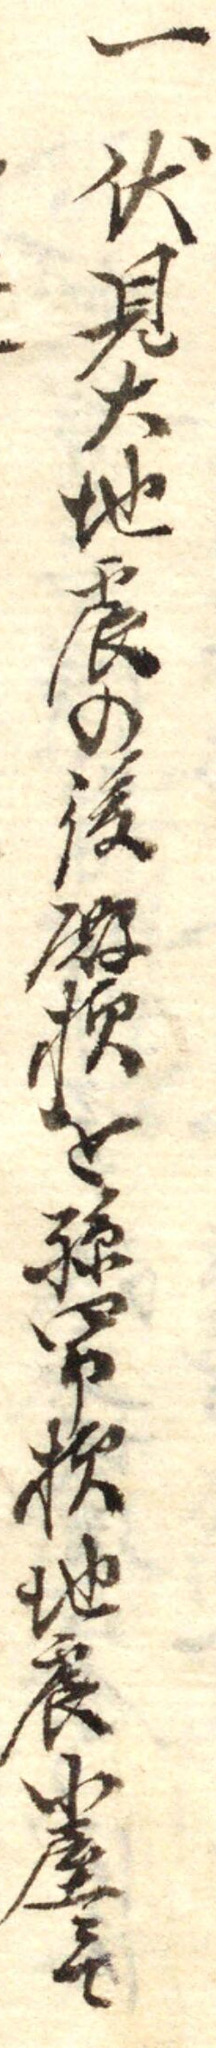一伏見大地震の後殿様を孫四郎様自身小屋にて
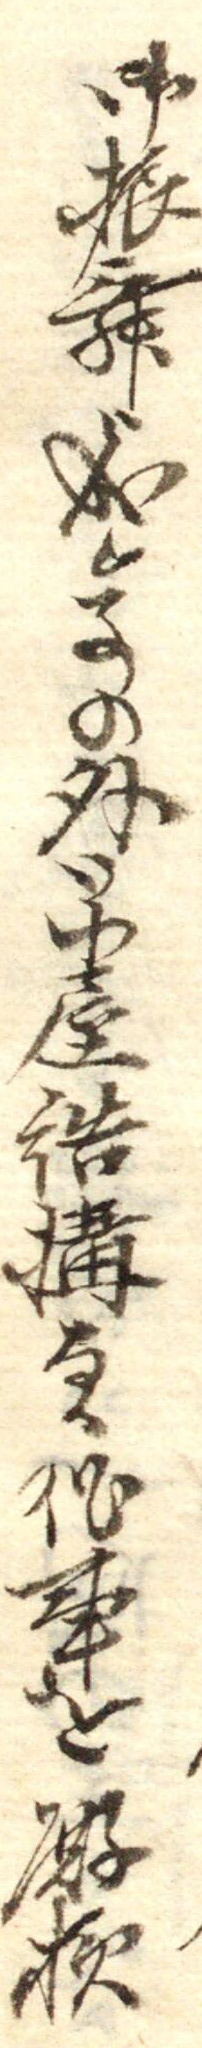御振舞被成候事の外御小屋結構なる作事を殿様
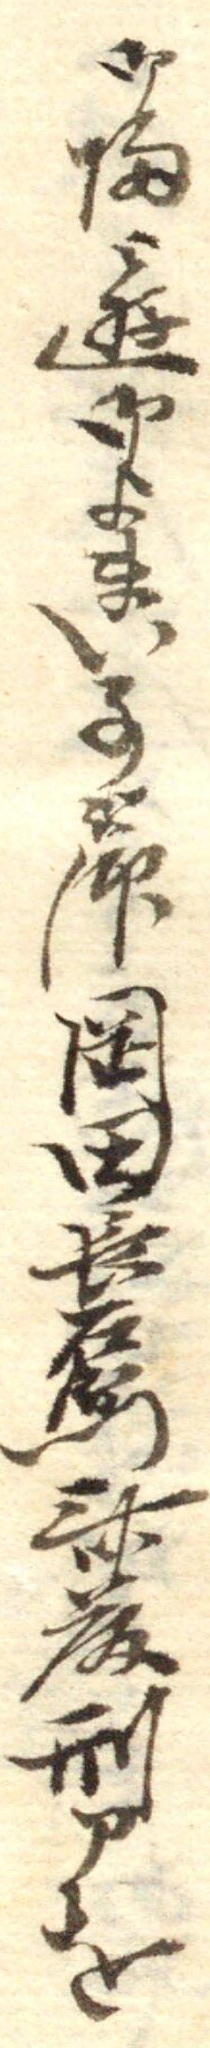御帰被遊御よまい事被仰岡田長右衛門斎藤刑部を

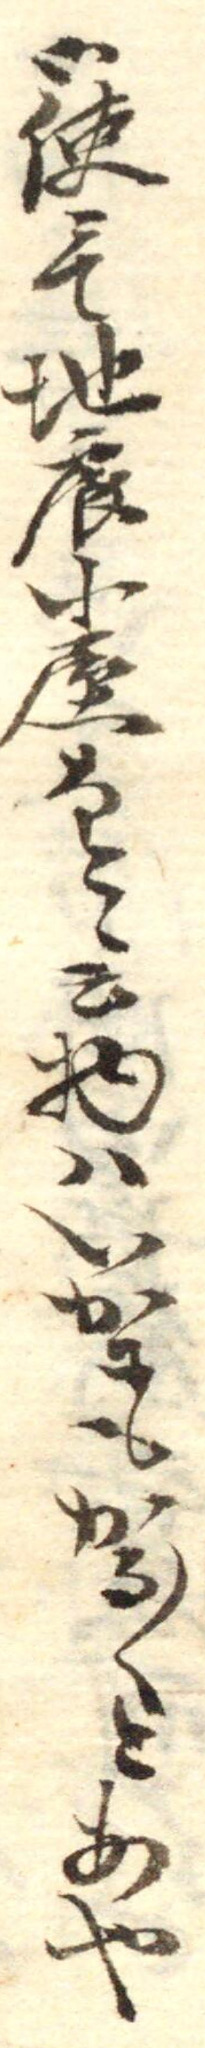御使にて地震小屋なとゝ云物はいかにもかるくとあや
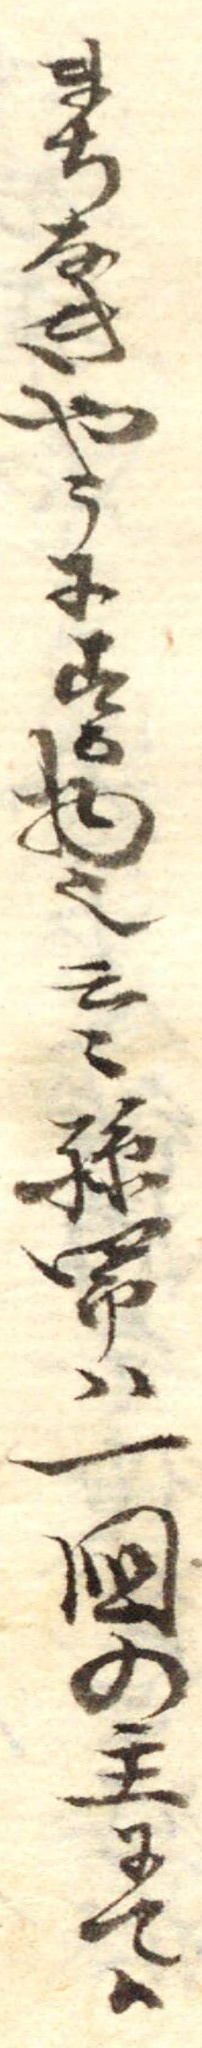まちなきやう尓春る物也云々孫四郎は一国の主尓て候
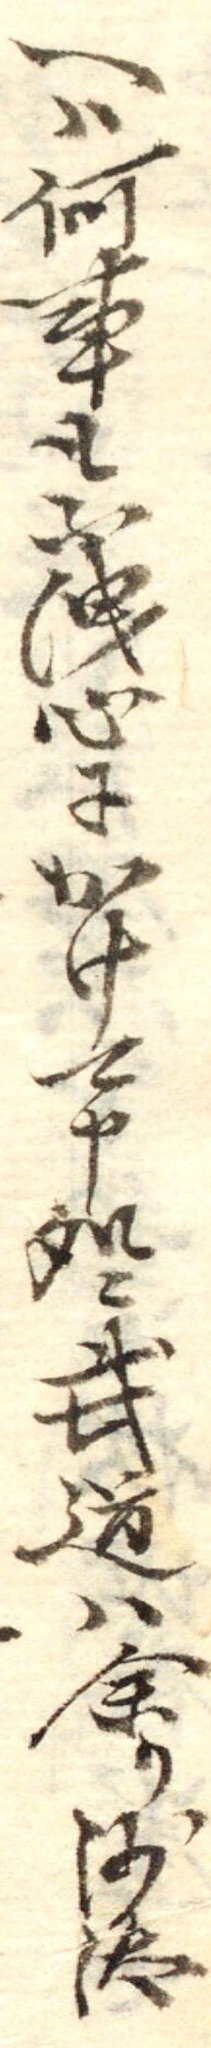へは何事もふ洩心尓かけ可申処に武道は余り沙汰
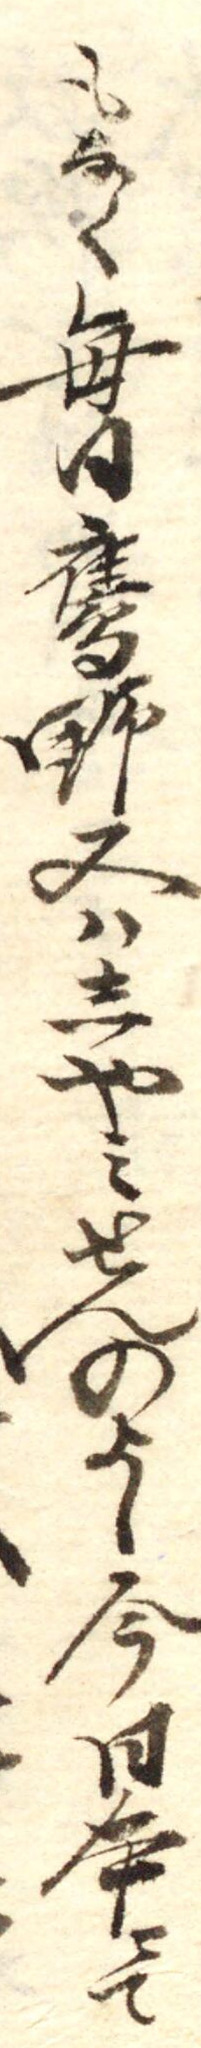もなく毎日鷹野又は仕志やみせんのよし今日本にて
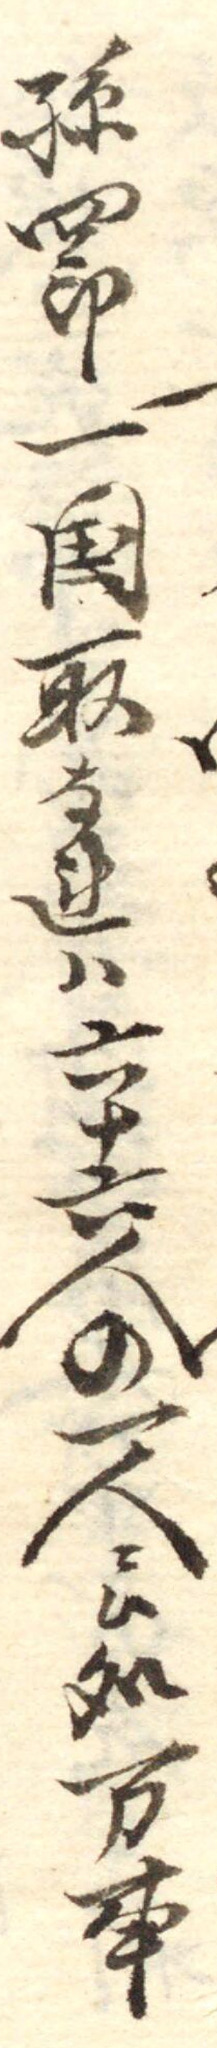孫四郎一国取な連は六十六人の一人に候処万事
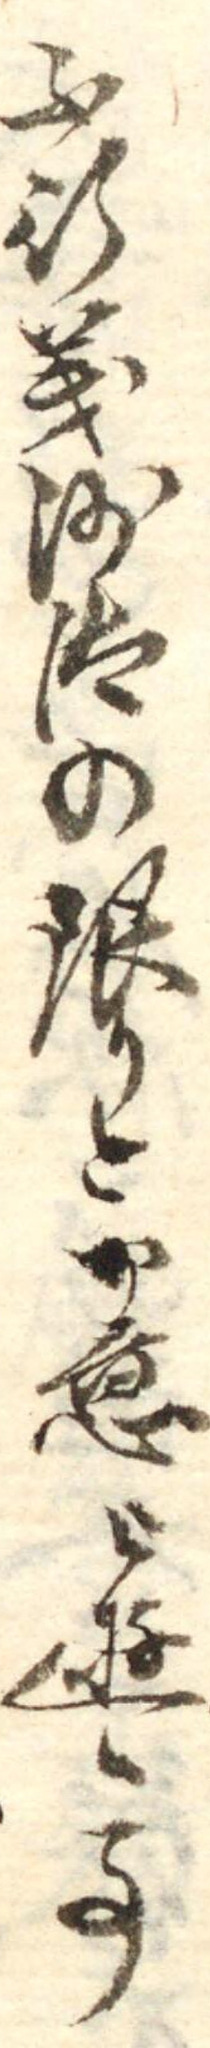ふ行義沙汰の限りと御意被遊候事
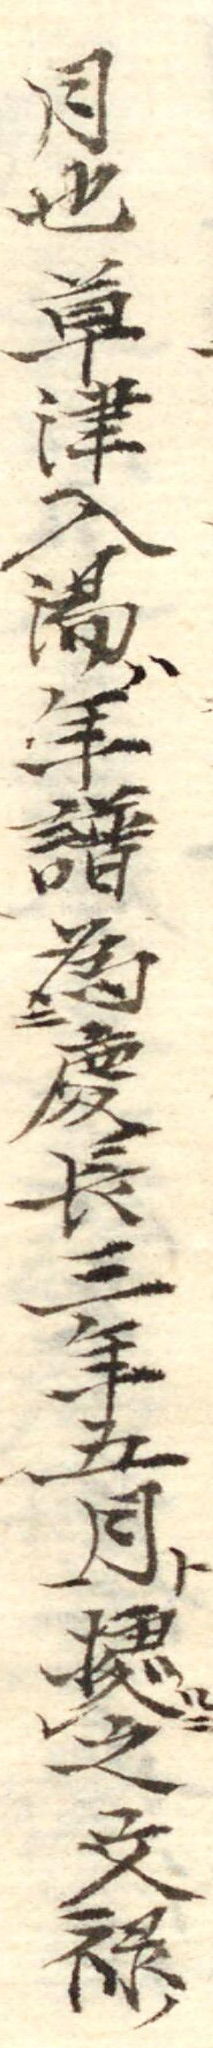月也草津入湯は年譜為慶長三年五月と據るに之文禄
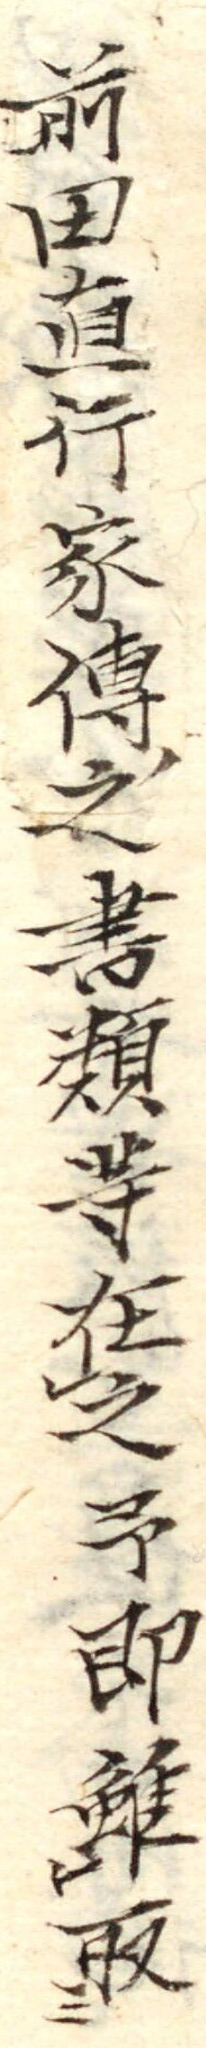前田直行家伝之書類等在之予即雖取
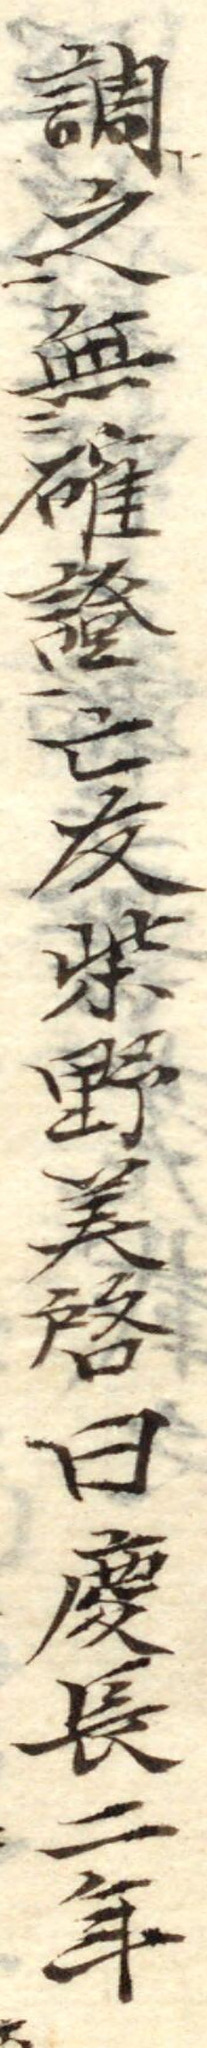調之無確證亡友柴野美啓曰慶長二年
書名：前田家封国証書集録
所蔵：Ishikawa Prefectural Library
